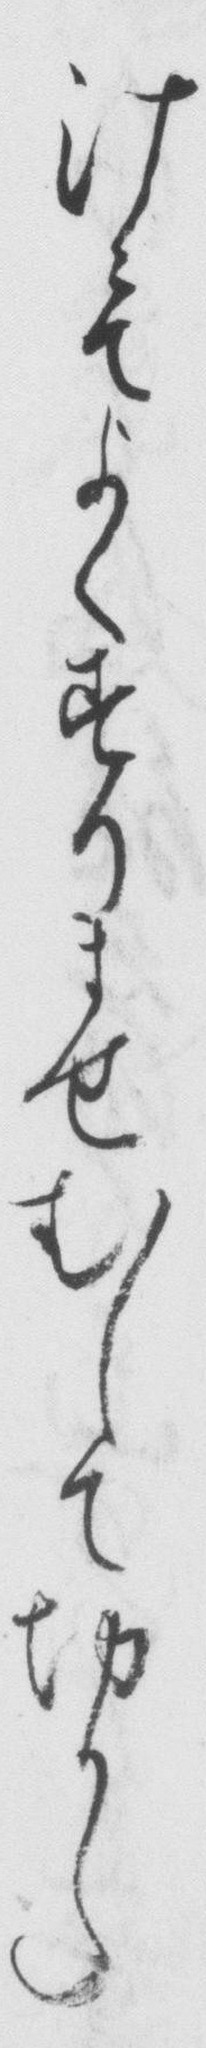とうふ汁にてすりませむして切かた
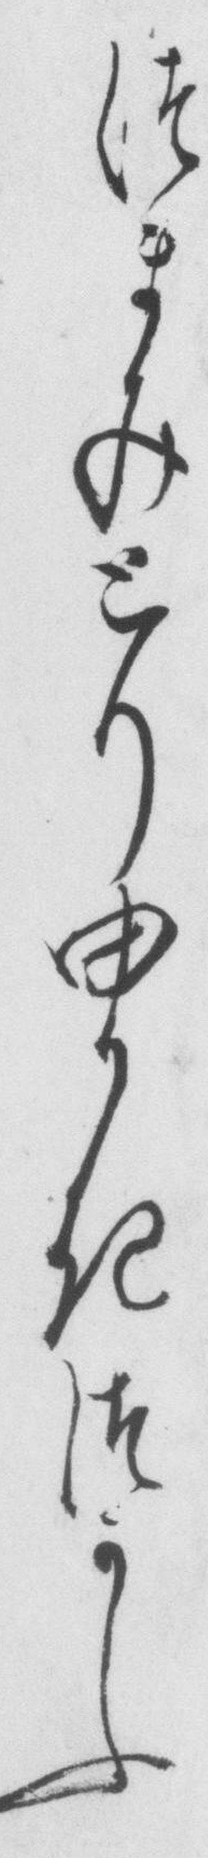つまみとりゆかきつかふ

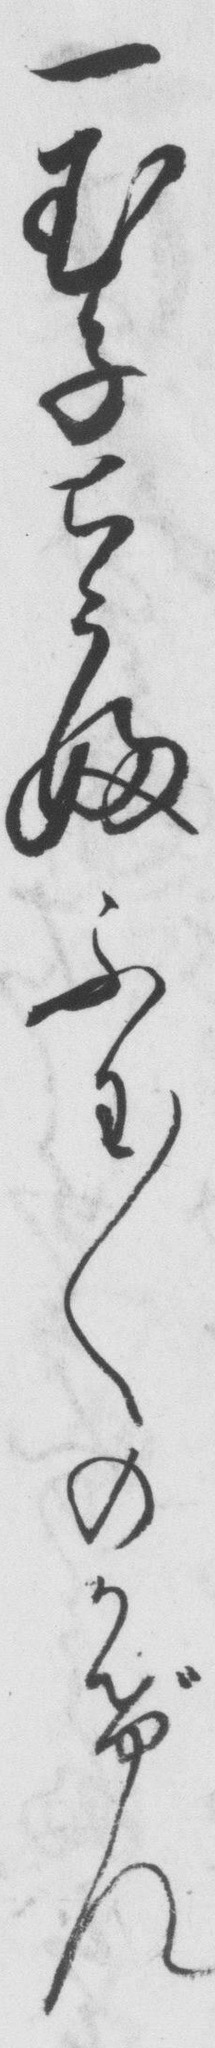一玉子とうふふわ〳〵のかげん
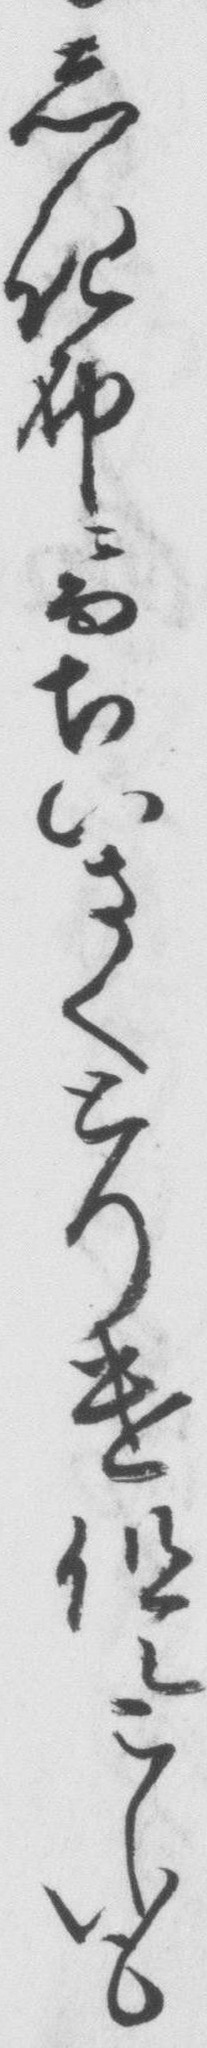しきしニちいさくとり遣但こしいも
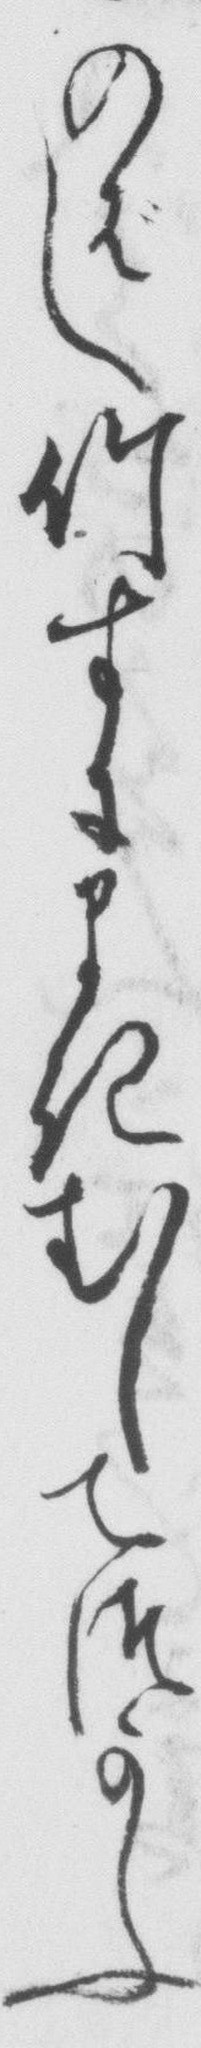のはし竹のすきにまきむしてつかふ
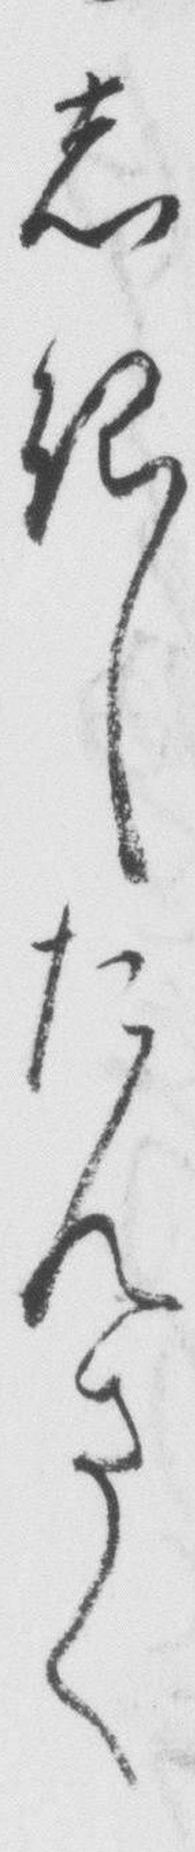しきしたんさく
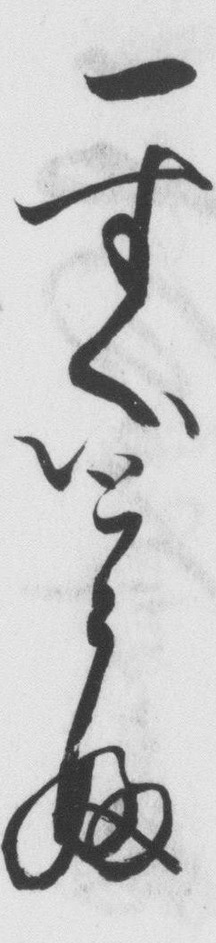一すくいとうふ
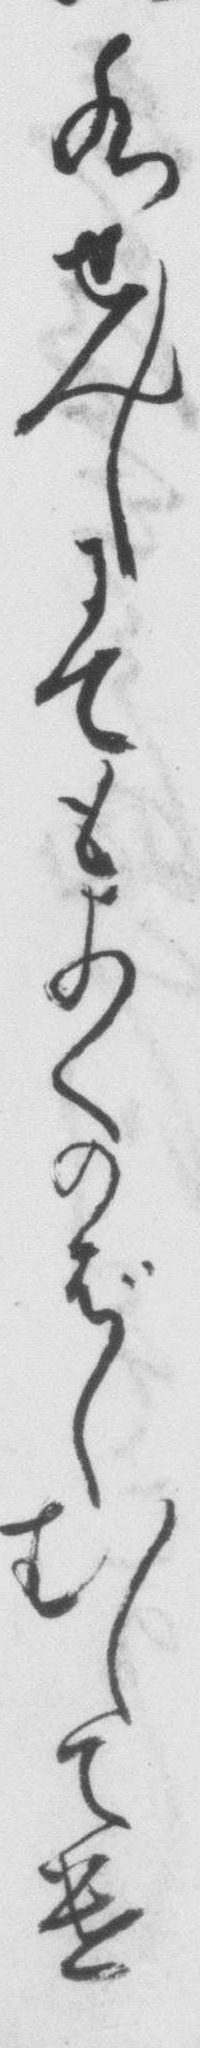水せんしにてもよくのばしむして遣う
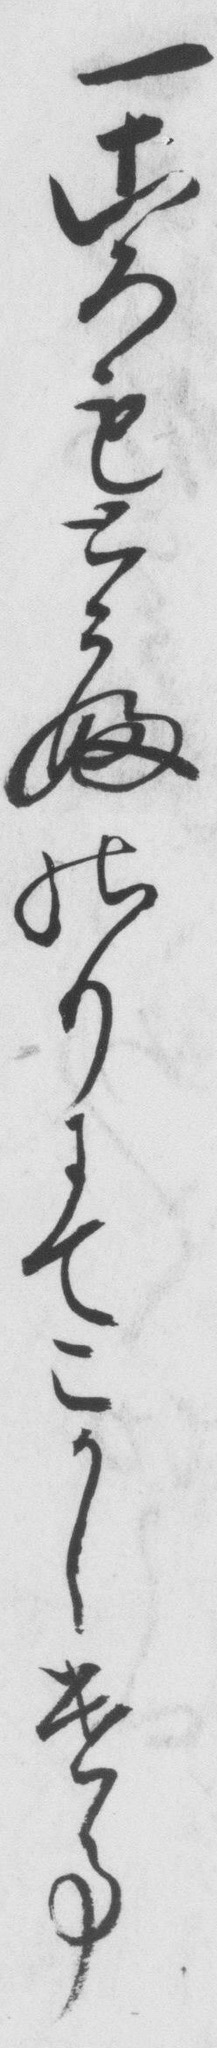一ころもとうふのりにてこかし遣ふ

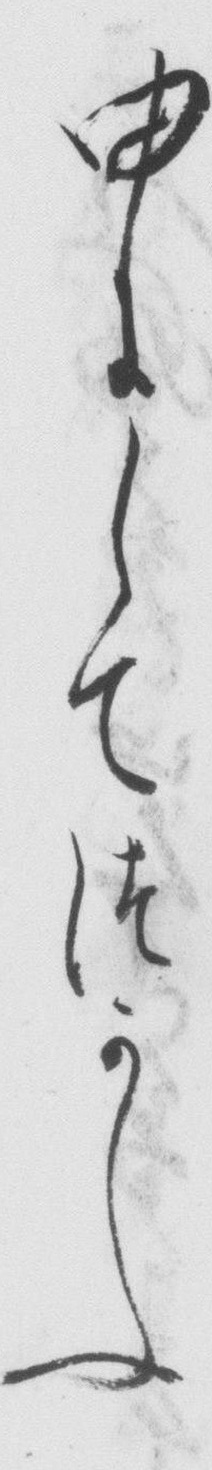ゆにしてつかふ
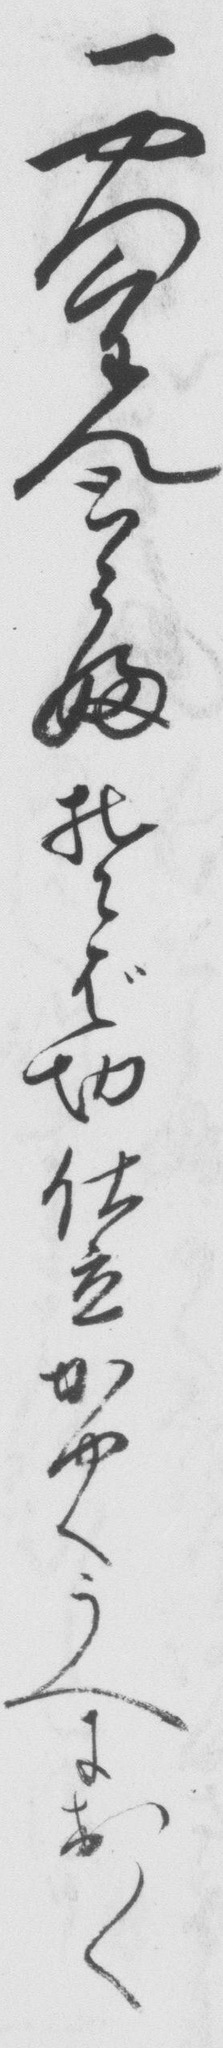一やつくわんとうふそば切仕立かやくうへにおく
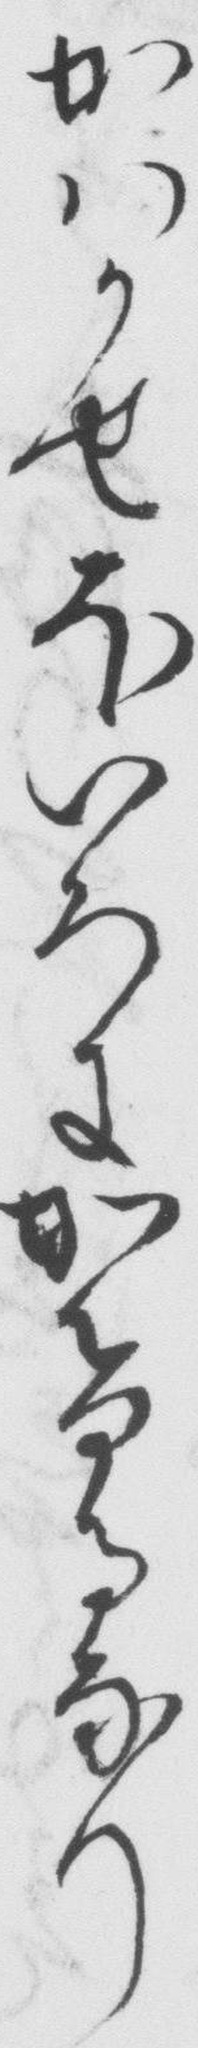かハかせほうりにかけるなり
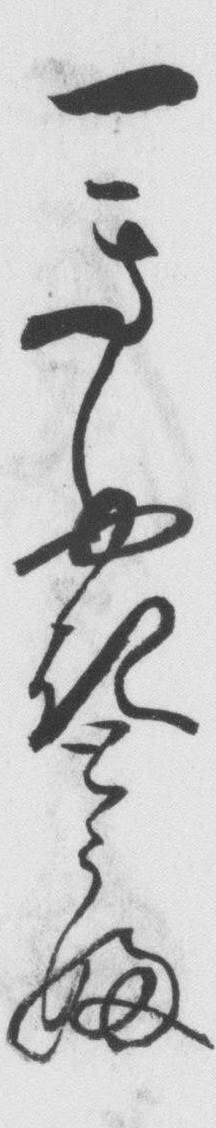一きやきとうふ
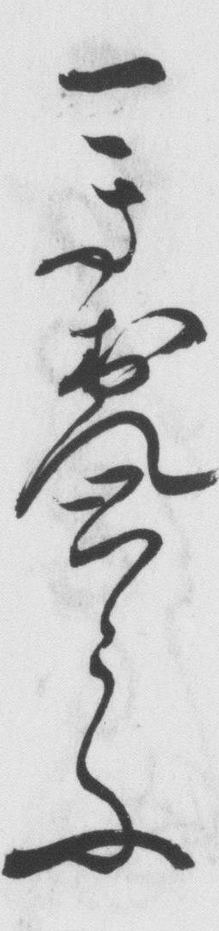一きおんとうふ
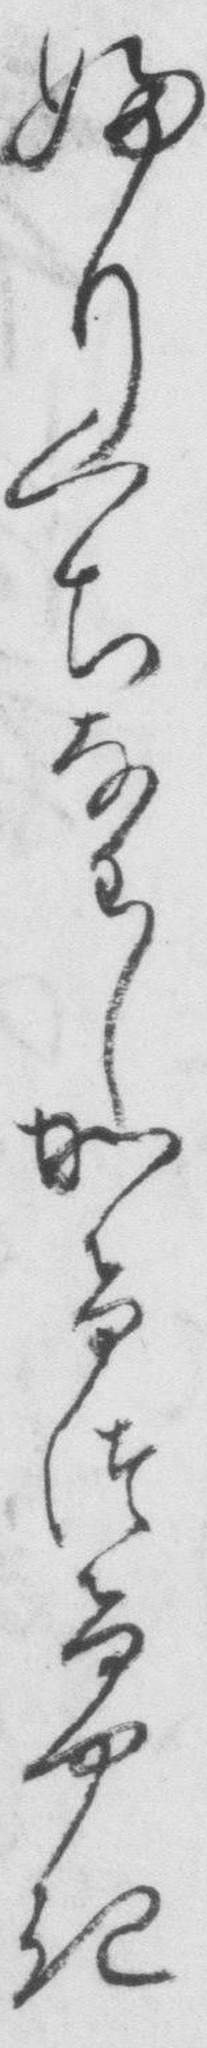りくちなわしかるつるやき

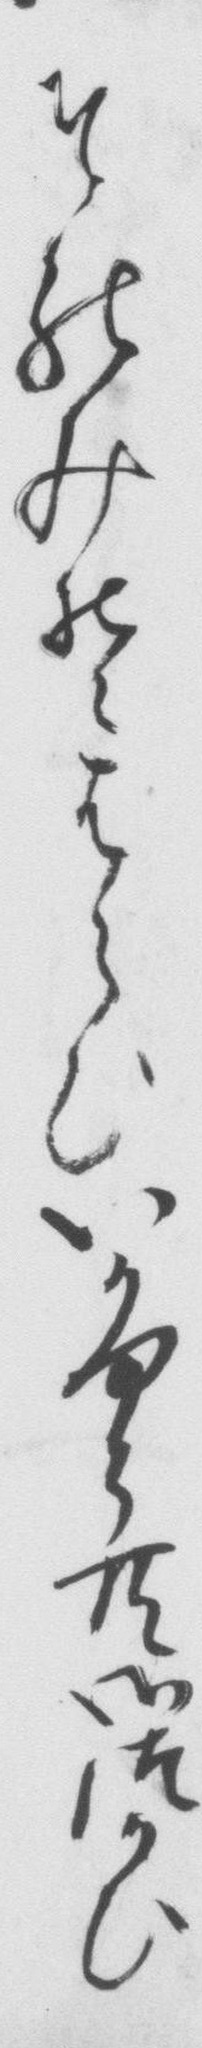とうふそのみそをはらひいかやうつかひ
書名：料理筌
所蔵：大阪府立大学学術情報センター 国文学研究資料館
